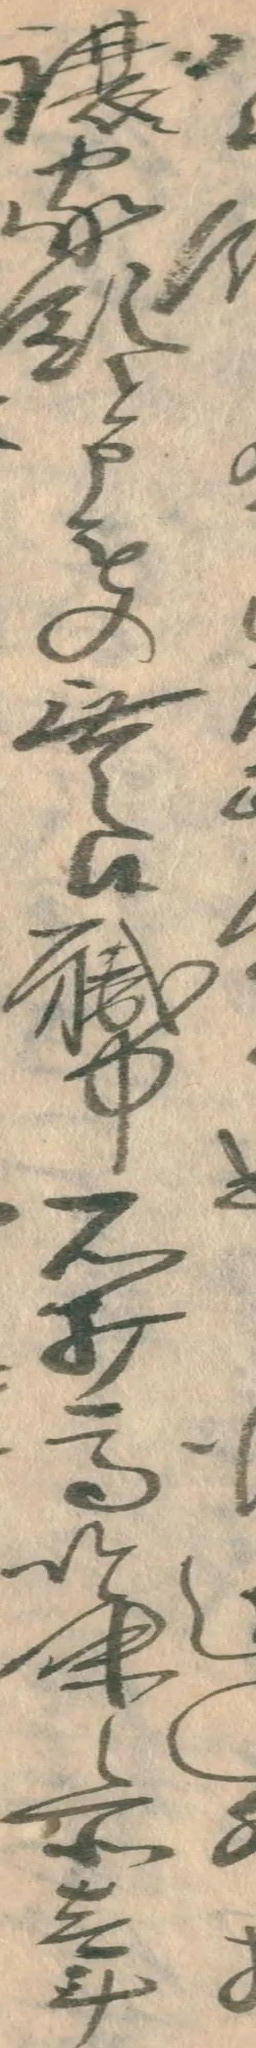譲家領と申もの無之候職中石打高吟味之所壱斗
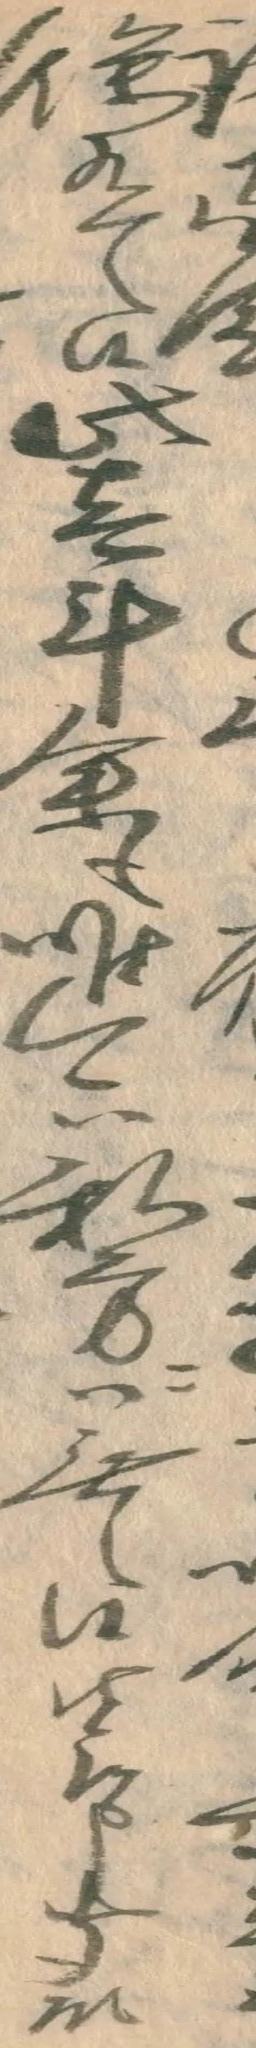余有之候此壱斗余も唯今ハ私方ニハ無之候由被申聞故
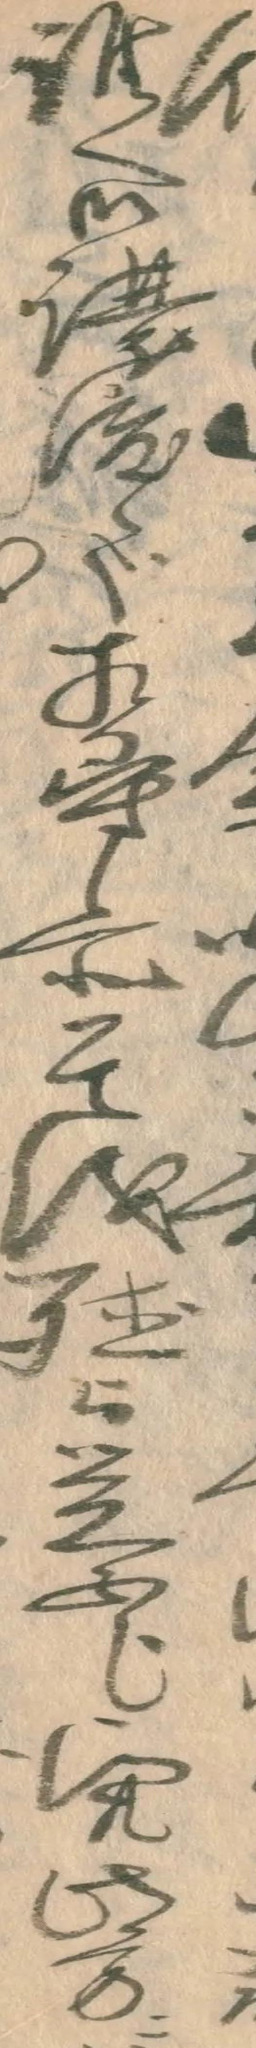誰へ御譲渡候哉相尋候所是儀殖与覚不申候得共此方ニハ
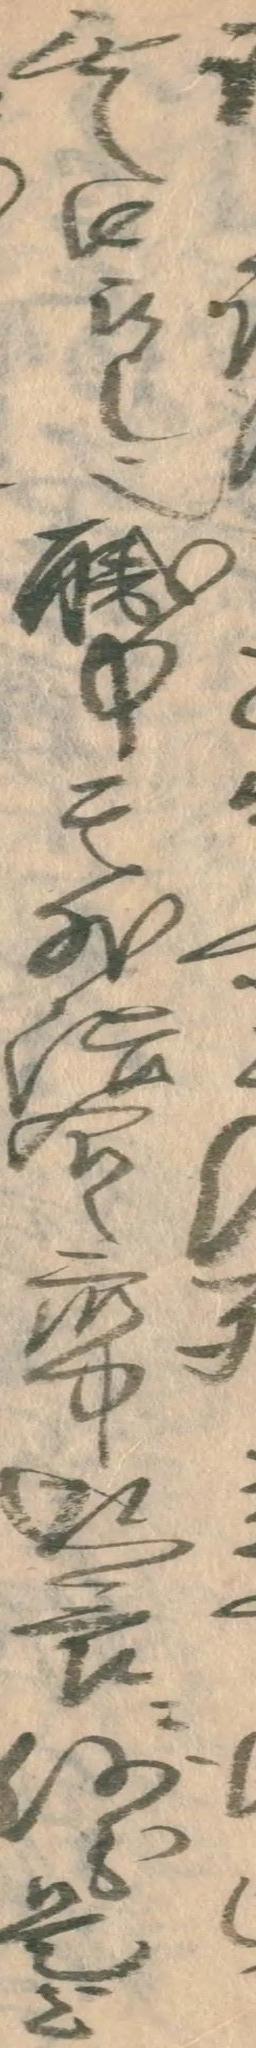無之由被申也職中其外詰合之衆中返答ニ何分是迄
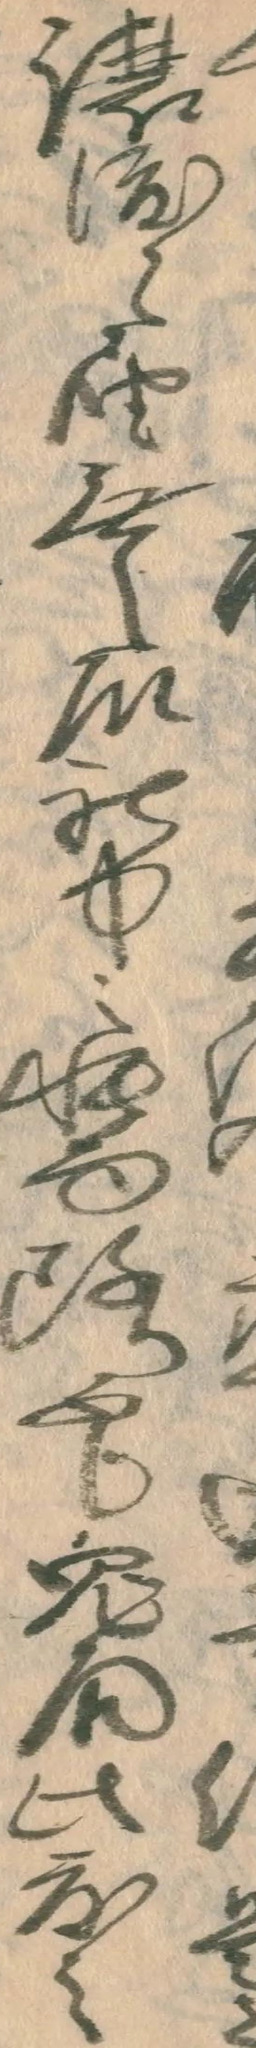譲渡之届無之故社中之帳面改り不申候兎角此度之
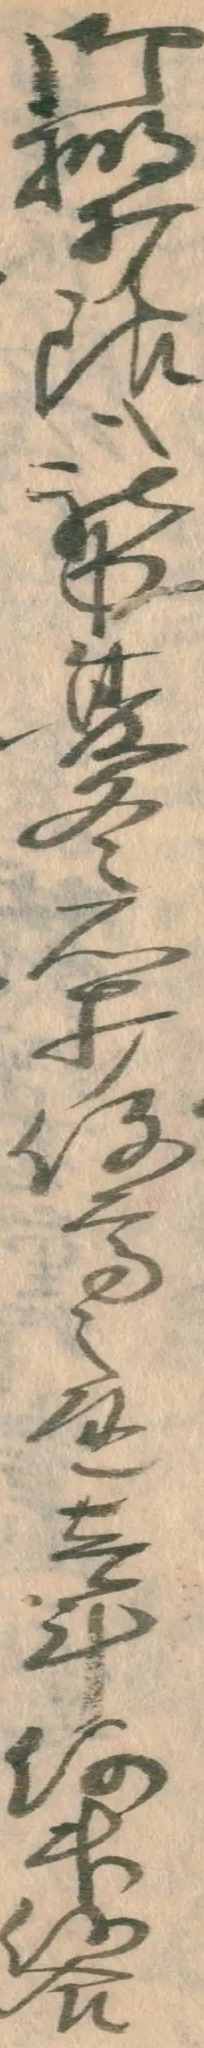御棚打銀も社中夏冬石打役高之通壱斗何升何合
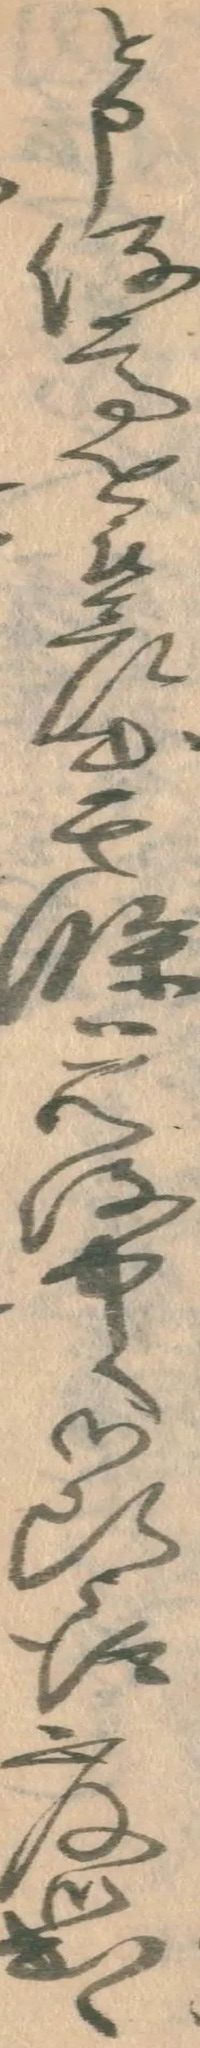と申役高を被差出其余は若役中へ御断被仰不及御出候
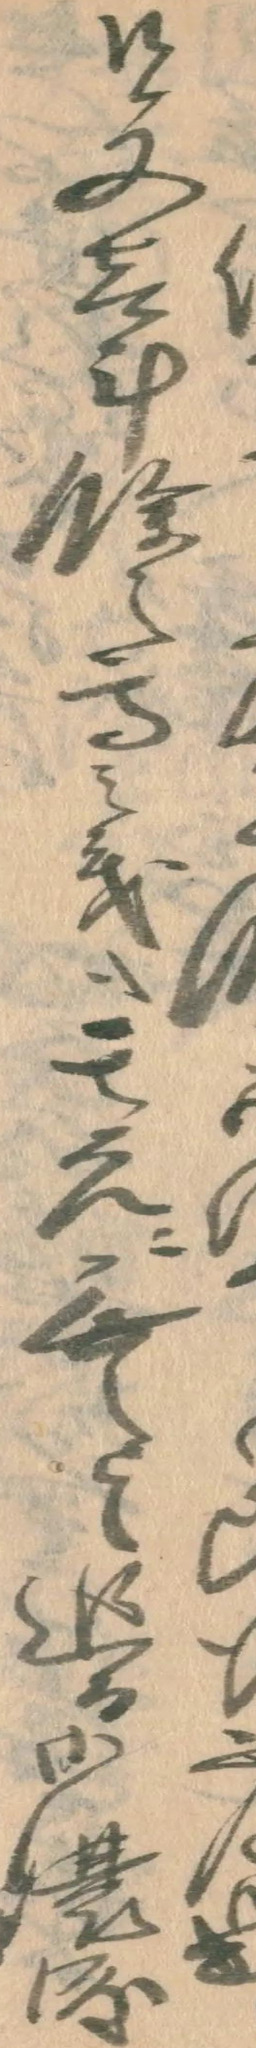且又壱斗余之高之義も其元ニ無之候ハヽ追而御譲渡
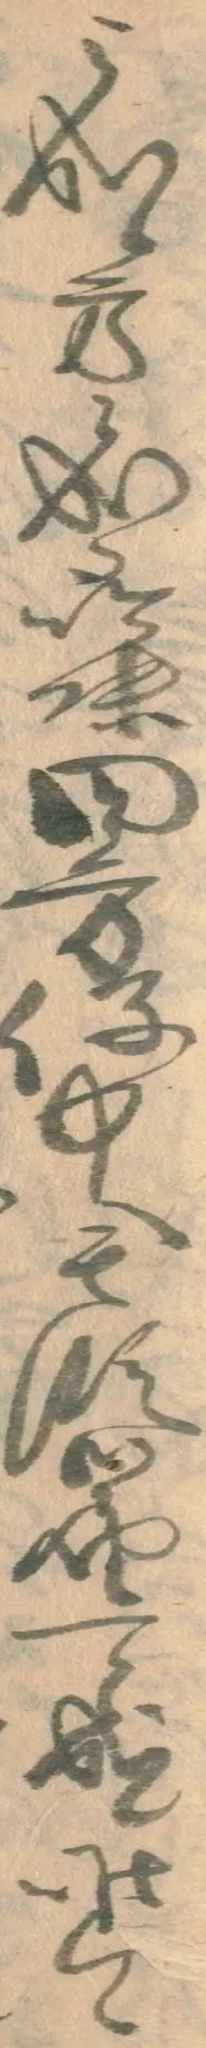被成候方ニ成御吟味田方役中へ其段御届可被成候唯今
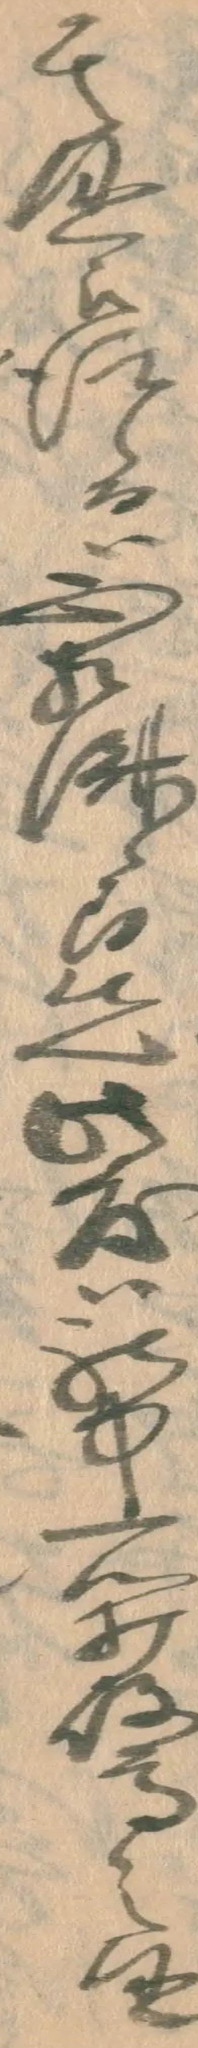其通被仰候而ハ不相済候間先此度ハ社中石打役高之通
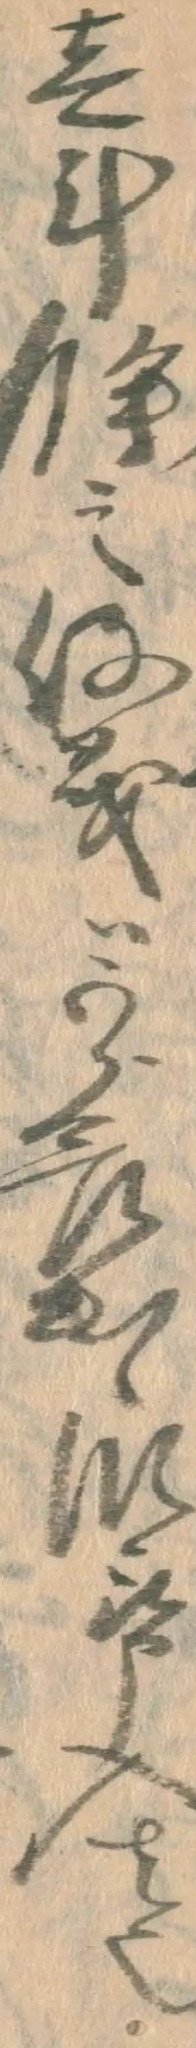壱斗余之役義ハ可被差出候段被申入者也
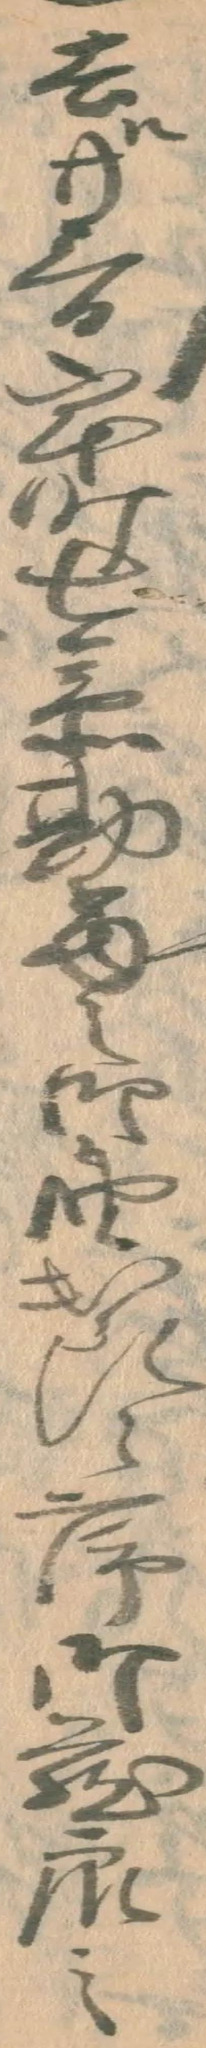一去ル廿三日山本町長兵衛勘当之御届出頭之序御蔵衆之
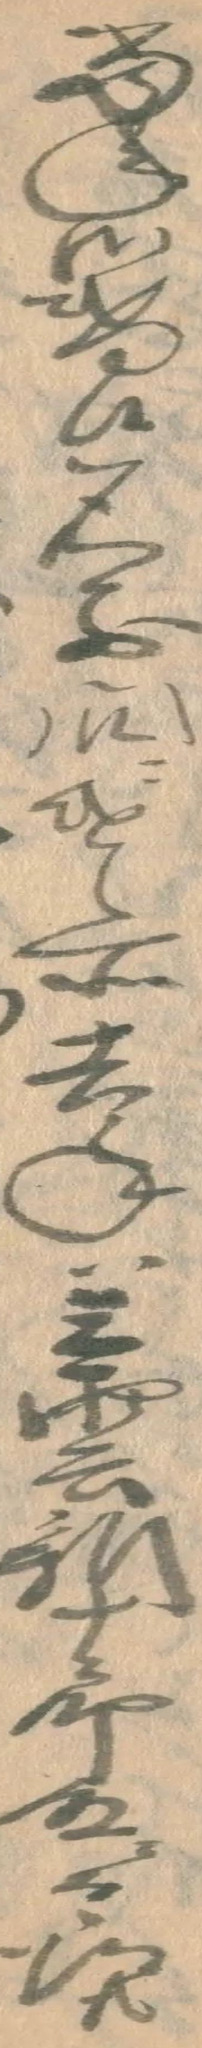当年御替候名前問ニ遣候所去年ハ三雲新十郎殿ニ而候得共
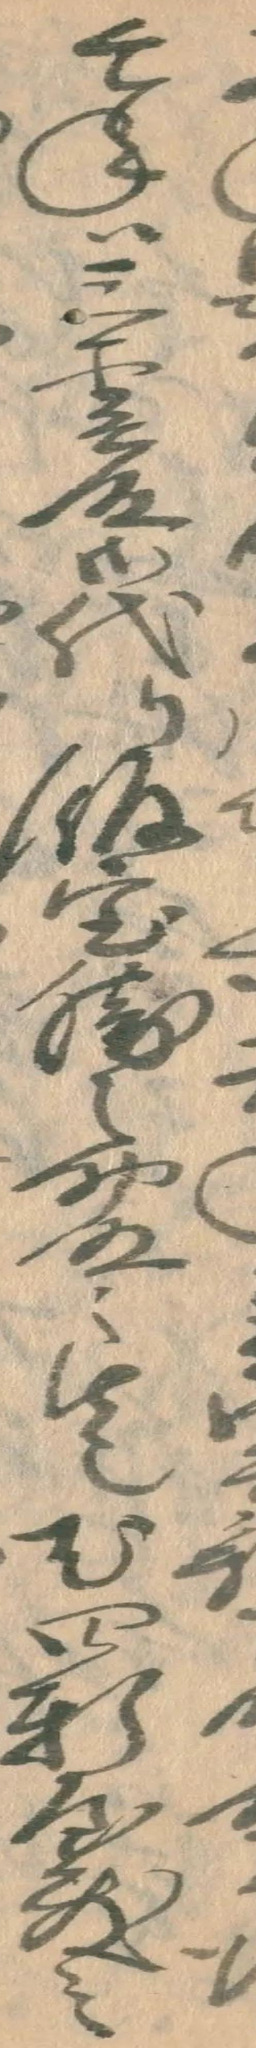今年ハ三雲殿御代り飯宝勝之助殿之由也尤四軒屋敷之
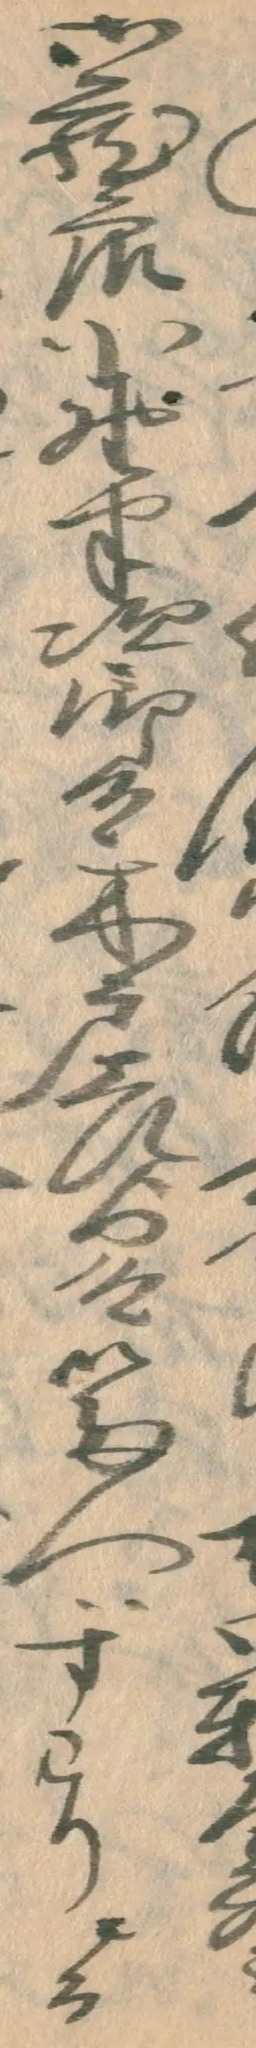御蔵衆小野半次郎殿木戸彦右衛門殿御両人ハすわりニ而
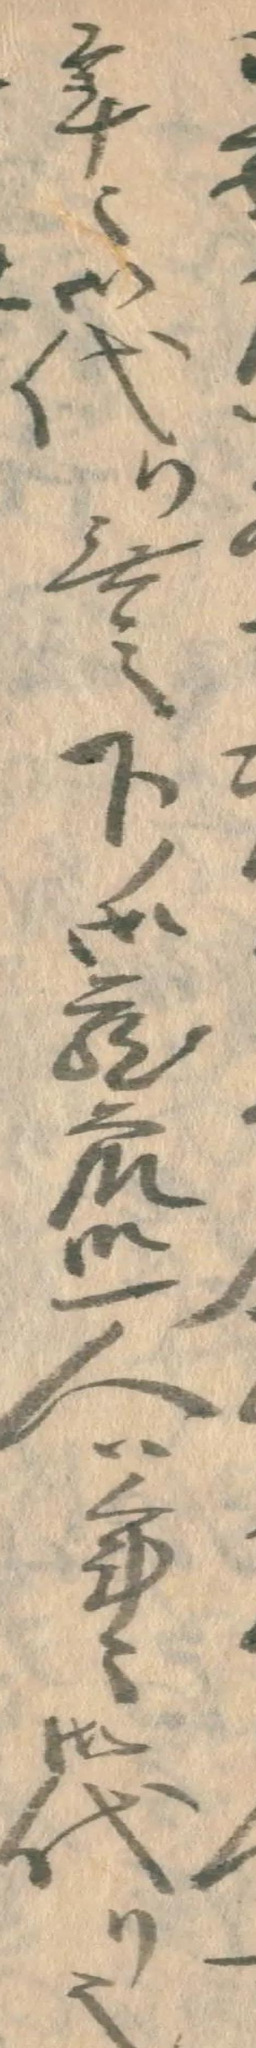年之御代り無之下ノ御蔵衆御一人ハ年々御代り也
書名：賀茂社記録. 第60冊
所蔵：国立国会図書館 National Diet Library, JAPAN
